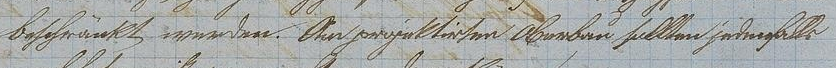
beschränkt werden. Am projektirten Oberbau sollten jedenfalls
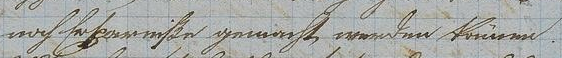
noch Ersparniße genacht werden können.
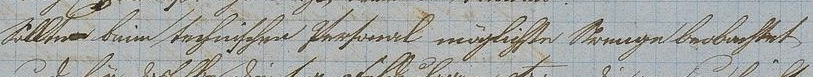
Sollte beim technischen Personal möglichste Strenge beobachtet
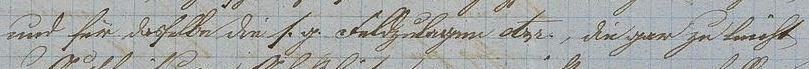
und für dasselbe die s.g. Feldzulagen etzr., die gar zu leicht
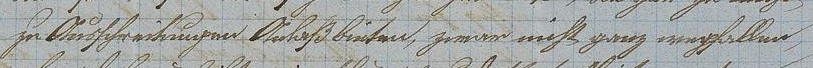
zu Ausschreitungen Anlaß bieten, zwar nicht ganz wegfallen,
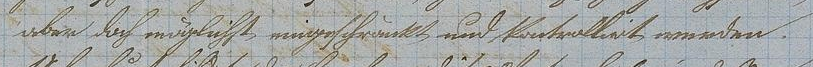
aber doch möglichst eingeschränkt und kontrollirt werden.
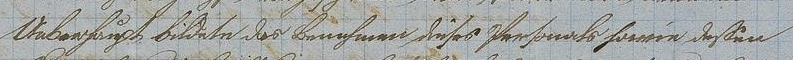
Ueberhaupt bildete das Benehmen dieses Personals sowie dessen
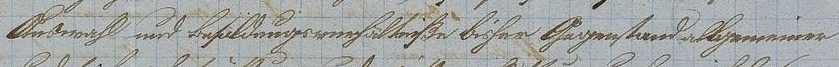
Auswahl und Besoldungsverhältniße bisher Gegenstand allgemeiner
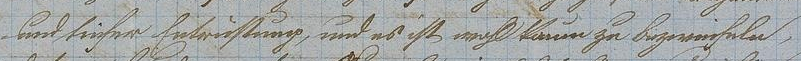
und tiefer Entrüstung, und es ist wohl kaum zu bezweifeln,
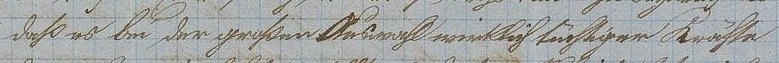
daß es bei der großen Auswahl wirklich tüchtiger Kräfte
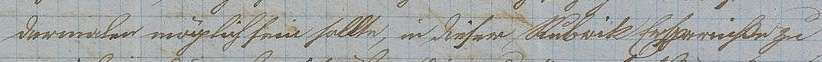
dermalen möglich sein sollte, in dieser Rubrik Ersparniße zu
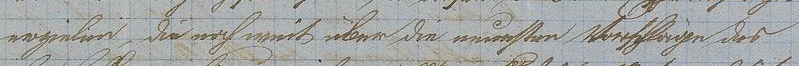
erzielen, die noch weit über die neuesten Vorschläge des
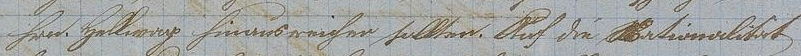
Hrn. Hellwag hinausreichen sollten. Auf die Nationalität
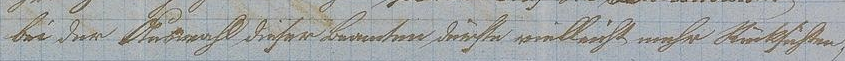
bei der Auswahl dieser Beamten dürfte vielleicht mehr Rücksichten
